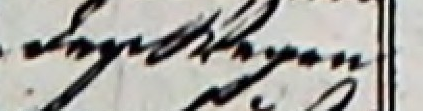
Den Wegen
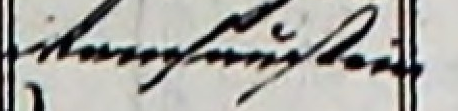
Denchaustein
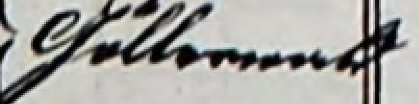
Gällerwald
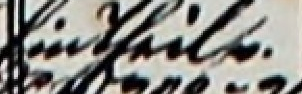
Ein Theil v.
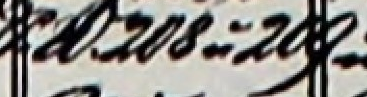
P.W. 208 u 209
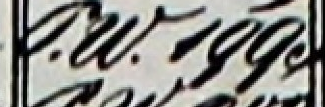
P.W. 199
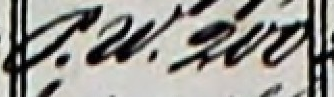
P.W. 200
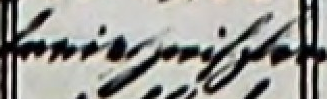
freie zwischen
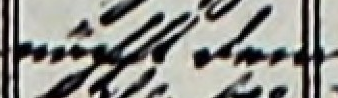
nächst den
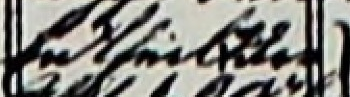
An Theil ???
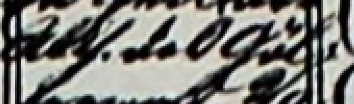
??? des Gäl„
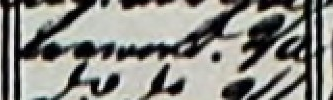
lerwald. 2/a
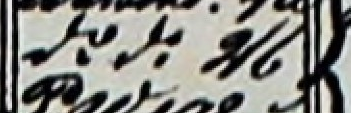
do do 2/b
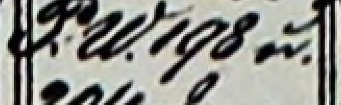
P.W. 198 u.
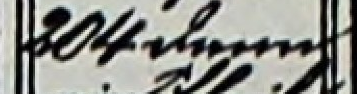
204 dann
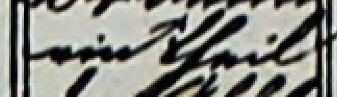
ein Theil
